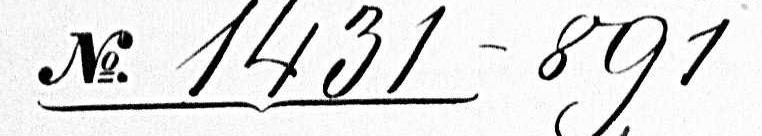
No 1431– 1891
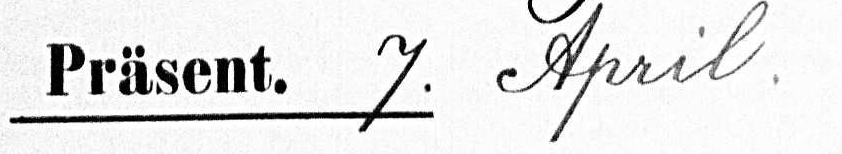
Präsent. – 7. April
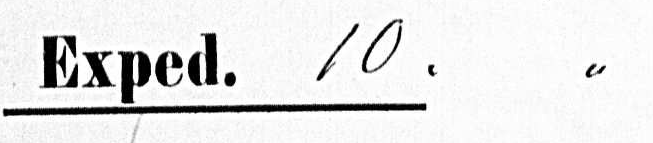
Exped. – 5. April
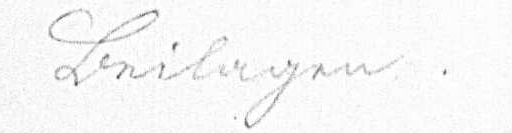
Beilagen
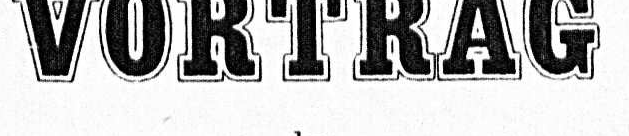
Vortrag
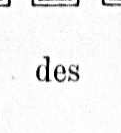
des
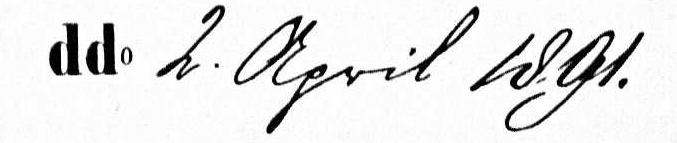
Ddo 2. April 1891
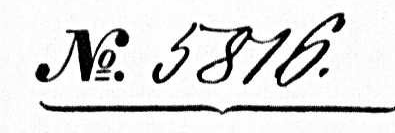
No. 5816
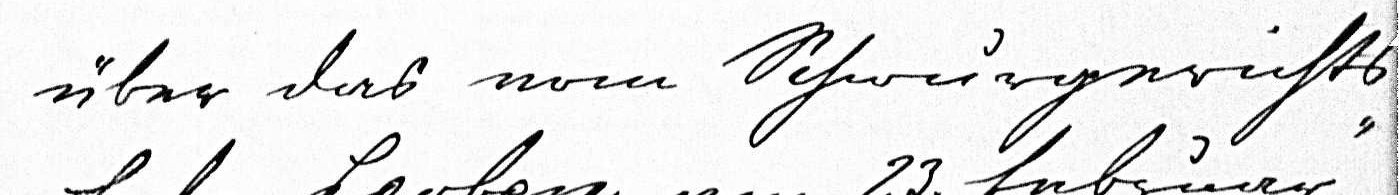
über das vom Schwurgerichts¬
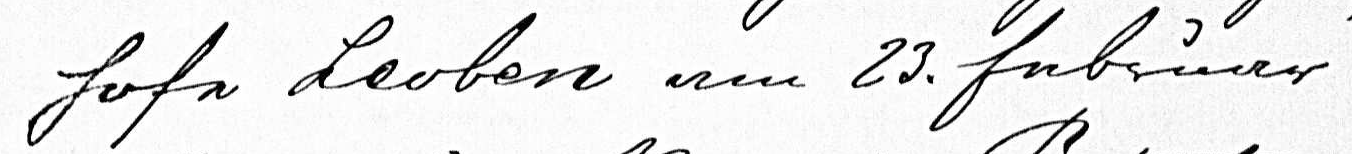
hofe Leoben am 23. Februar
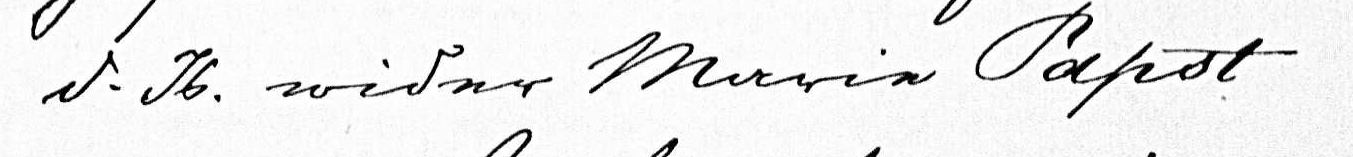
d. Js. wider Marie Papst
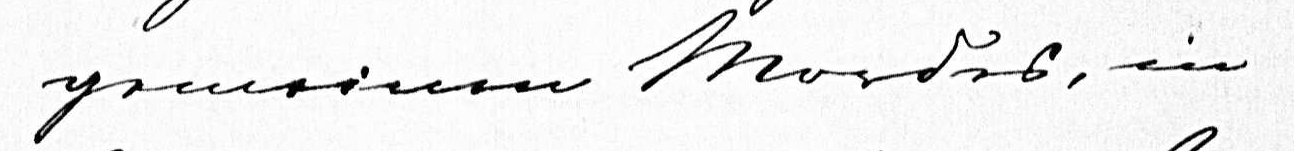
gemeinen Mordes, in
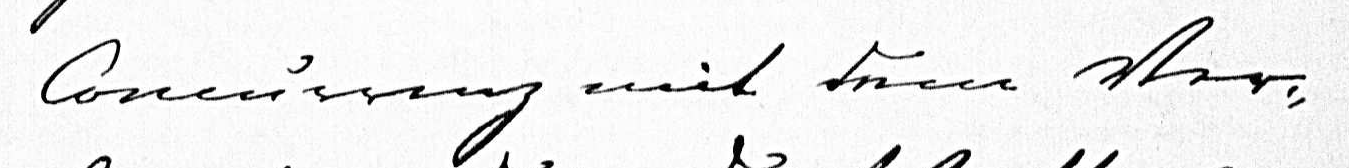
Concurrenz mit dem Ver¬
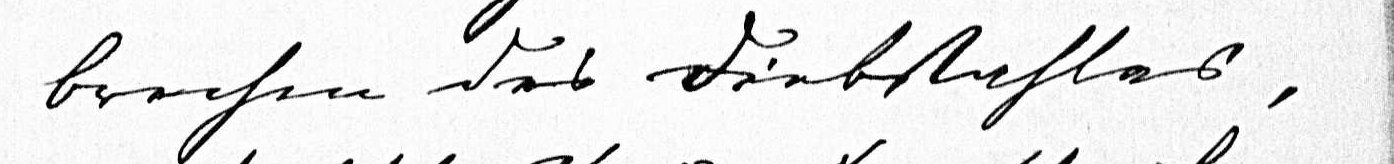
brechen des Diebstahles,
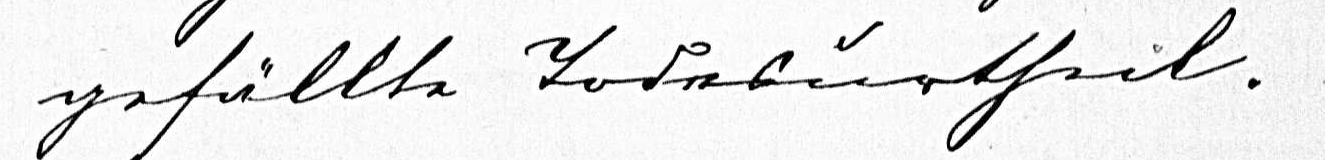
gefällte Todesurtheil.
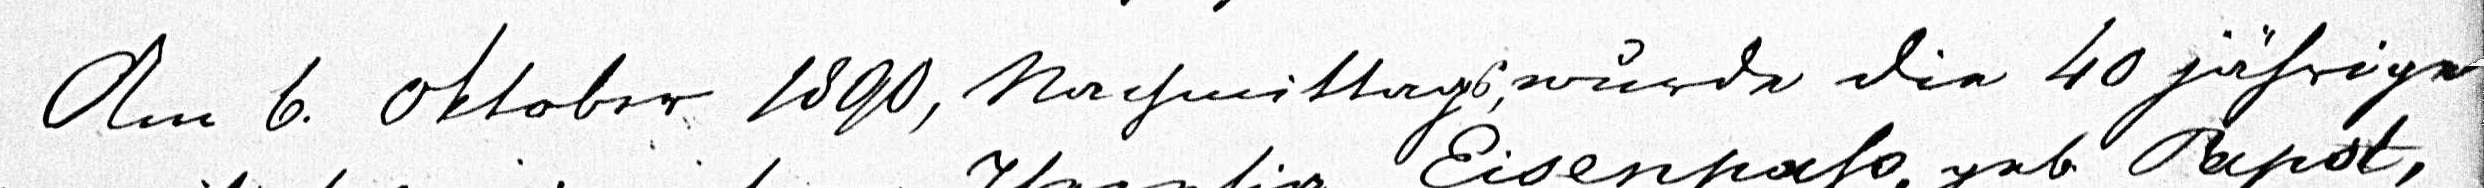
Am 6. Oktober 1890, Nachmittags, wurde die 40jährige
